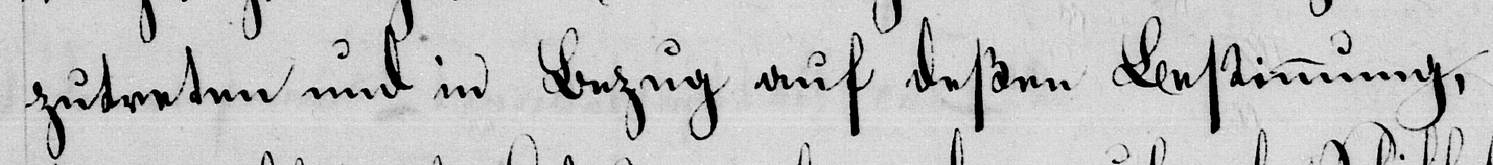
zutreten und in Bezug auf deßen Bestimmung,
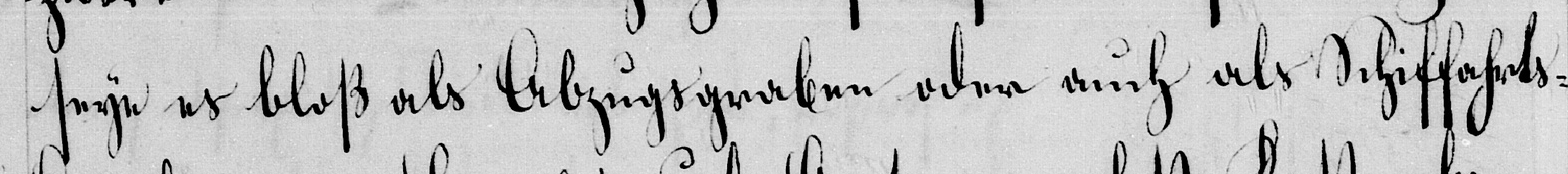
seye es bloß als Abzugsgraben oder auch als Schiffahrt¬
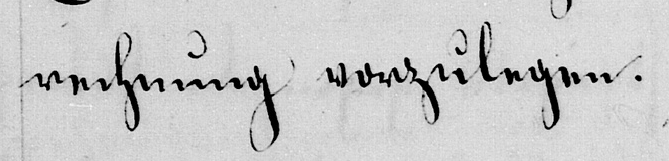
rechnung vorzulegen.
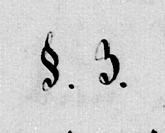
§. 3.
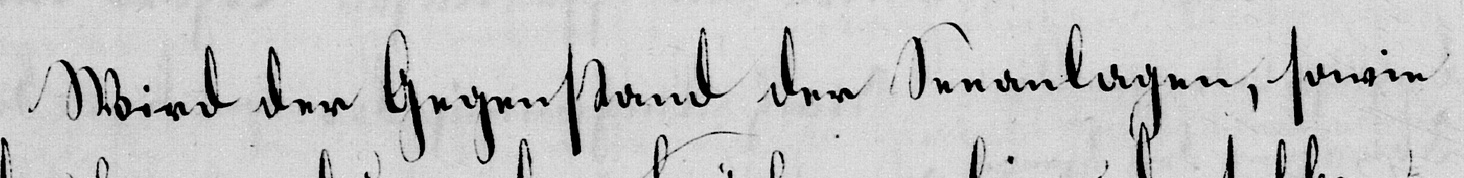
Wird der Gegenstand der Seeanlagen, sowie
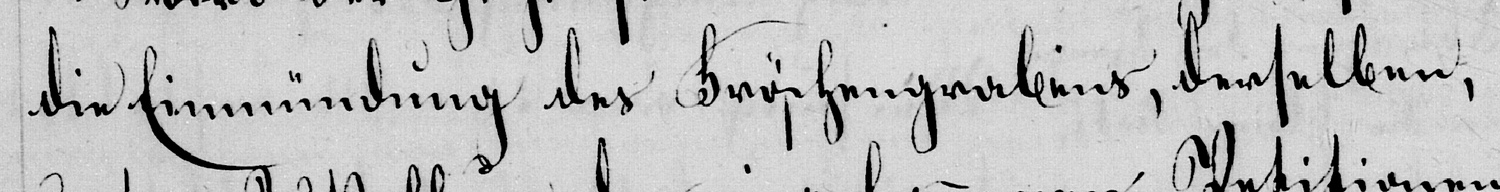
die Einmündung des Fröschengrabens, derselben,
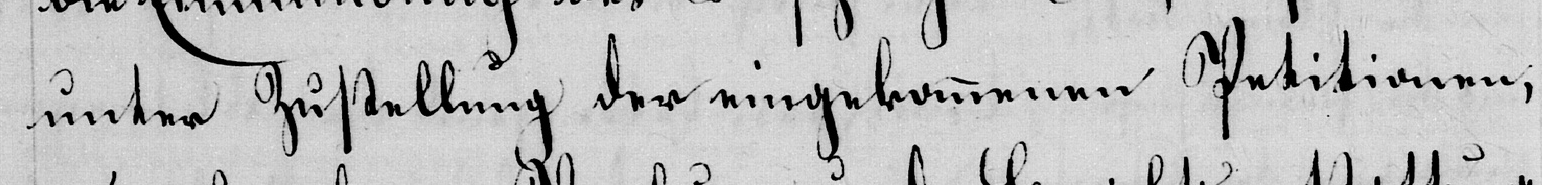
unter Zustellung der eingekommenen Petitionen,
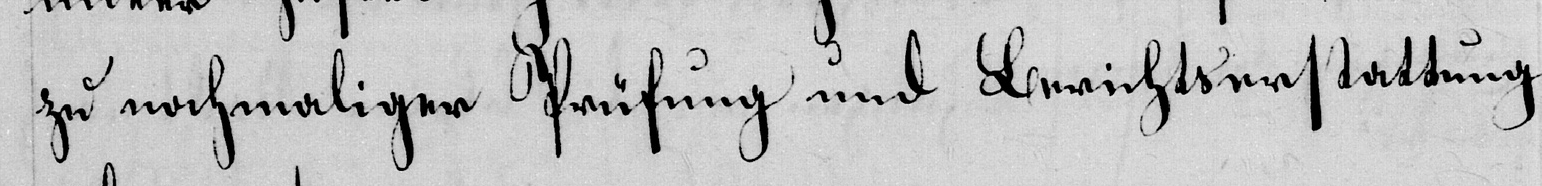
zu nochmaliger Prüfung und Berichtserstattung
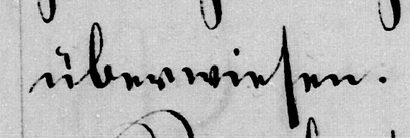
überwiesen.
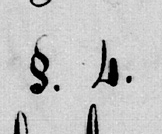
§. 4.
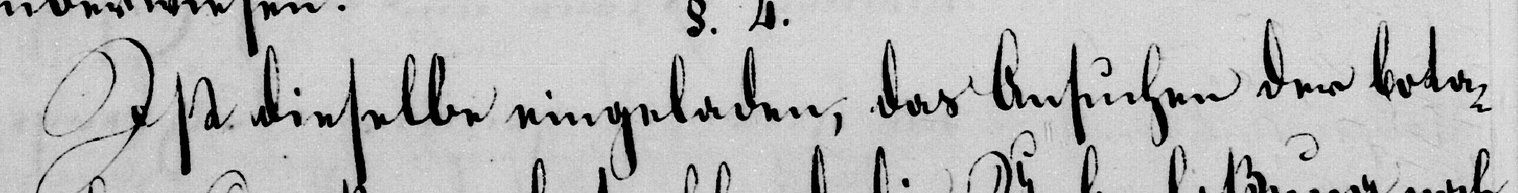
Ist dieselbe eingeladen, das Ansuchen der bota¬
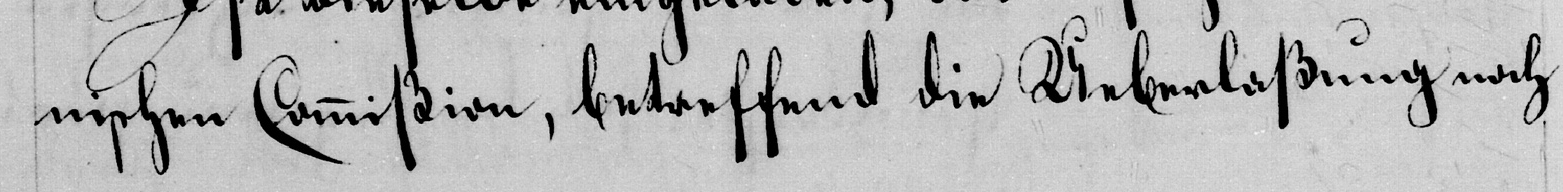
nischen Commißion, betreffend die Ueberlaßung noch
